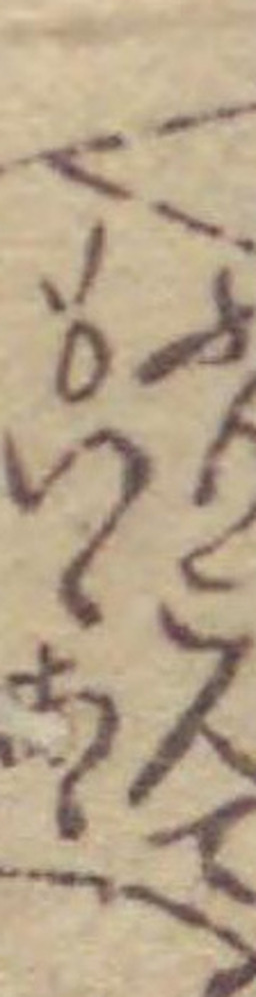もいゝあゝ
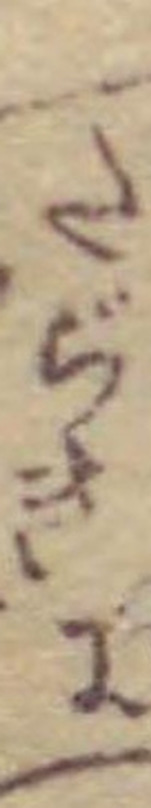たぢきに
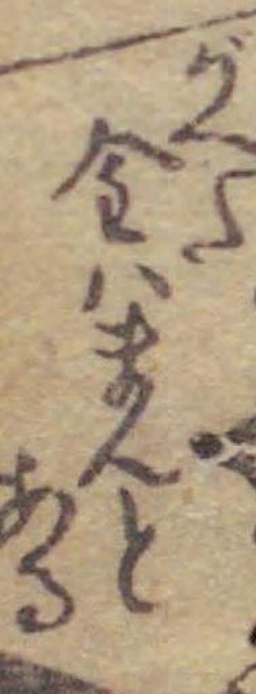金はまんと
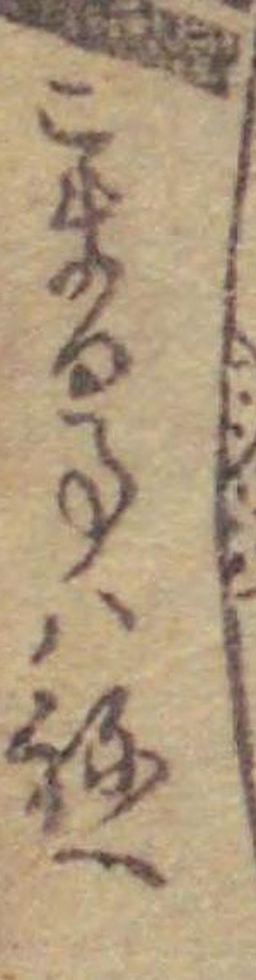こまる事はねへ

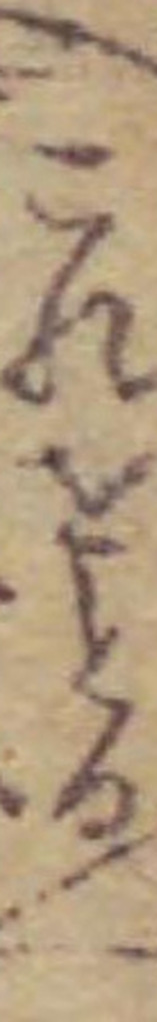これをとる
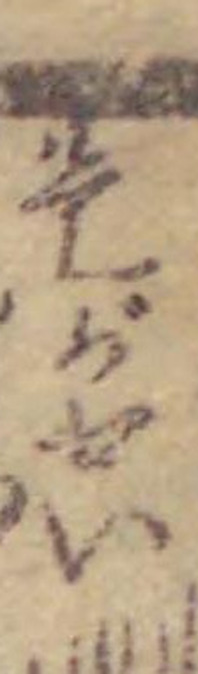是がせい
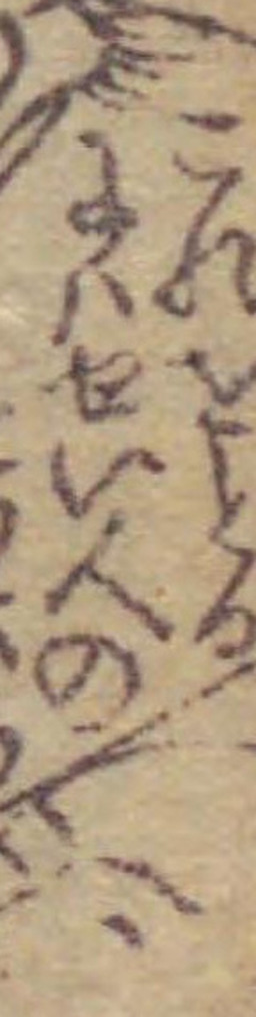にはせい人の
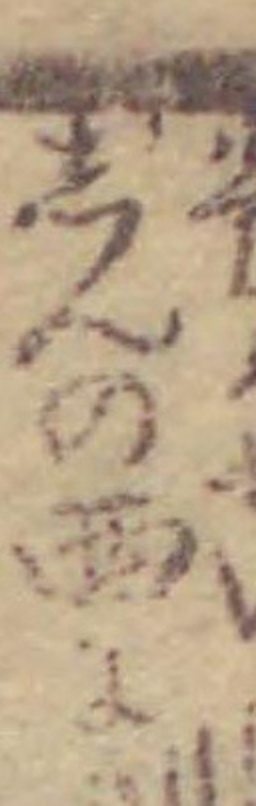じんの西に
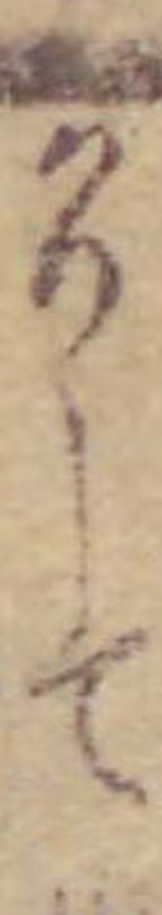かりして
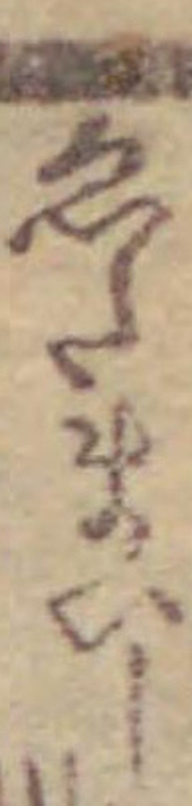ゑたまいし
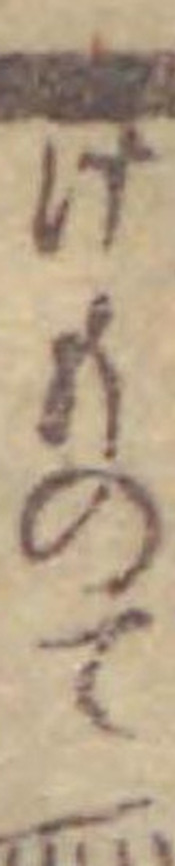けものて
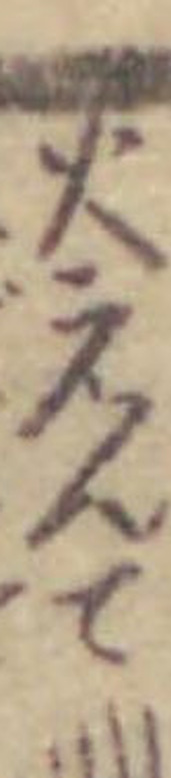火えんて
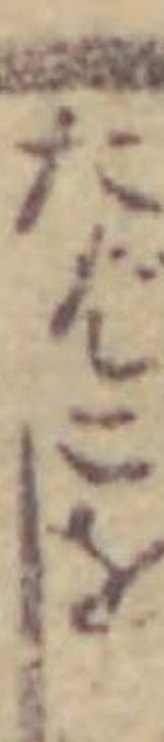たばこを
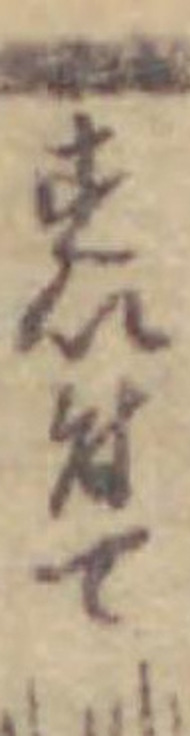すい付て
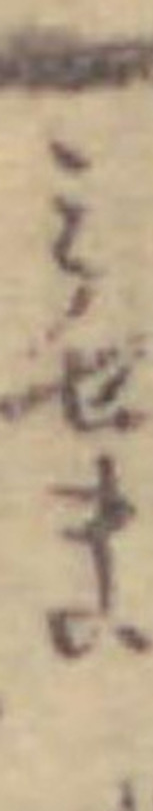みせま
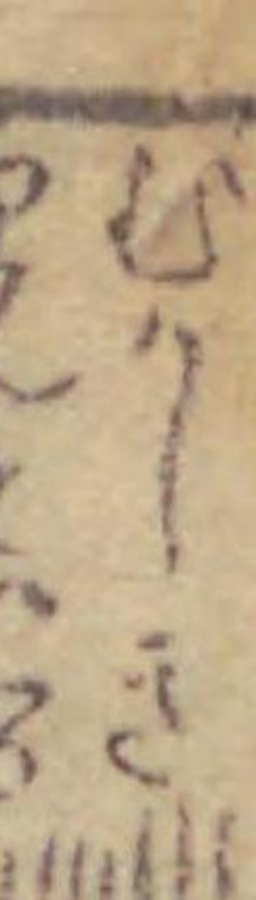りんといへる
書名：天下一面鏡梅鉢 : 3巻
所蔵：国立国会図書館 National Diet Library, JAPAN
